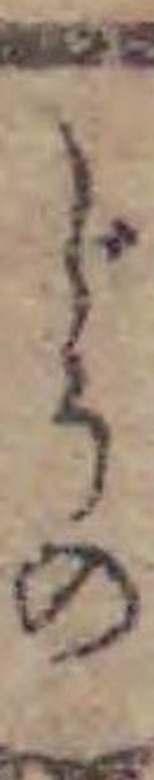じうの
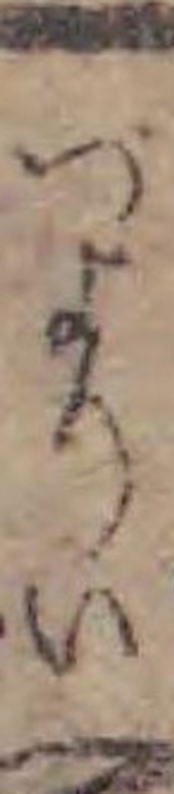つよりい
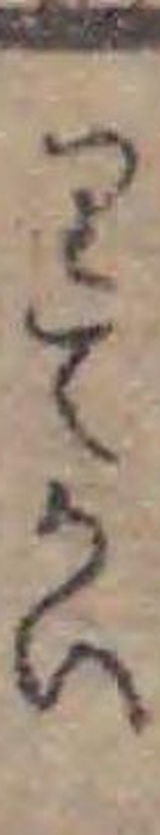りてかい
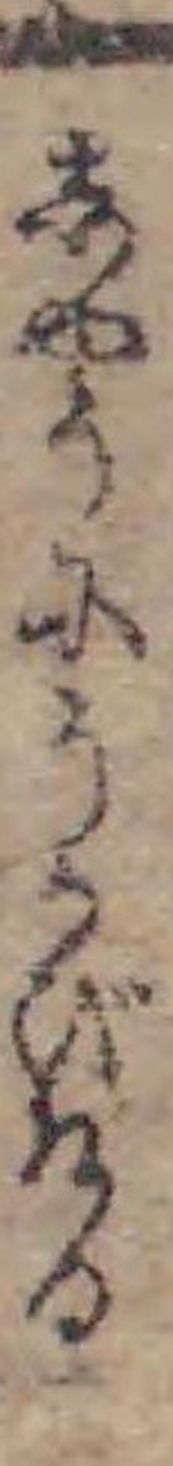しやうにうかびける
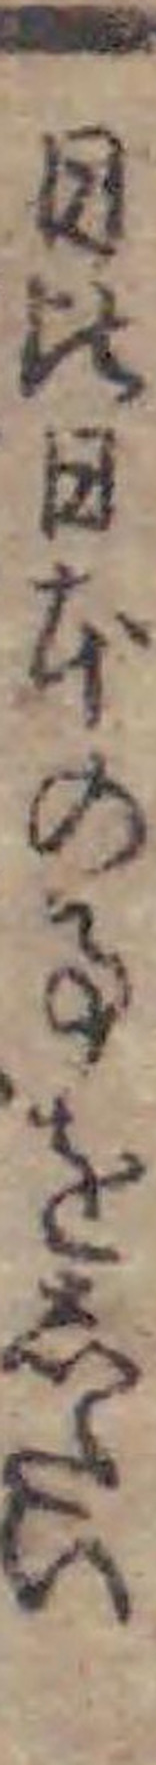日比日本の事をしたい
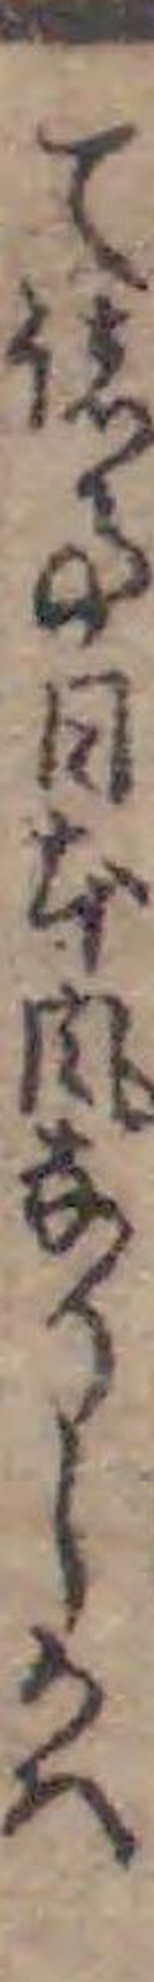て諸事日本風なりしかは
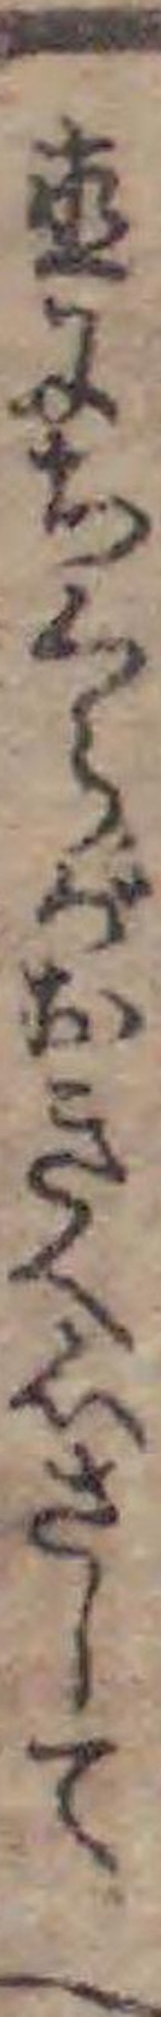直にちくらがおきへ心さして
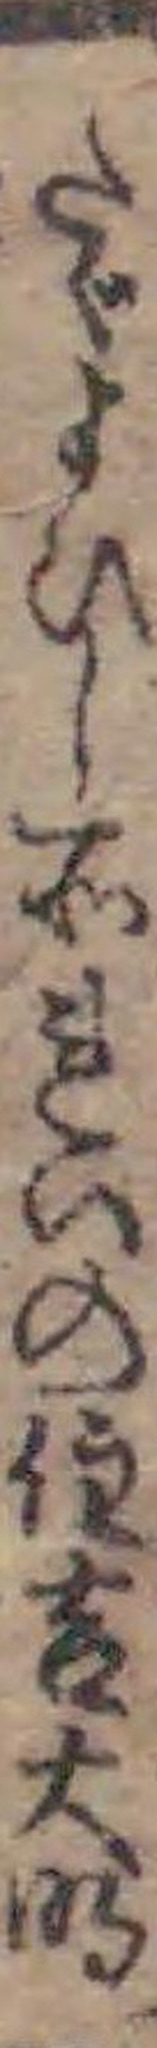たゞよひし所れいの住吉大明
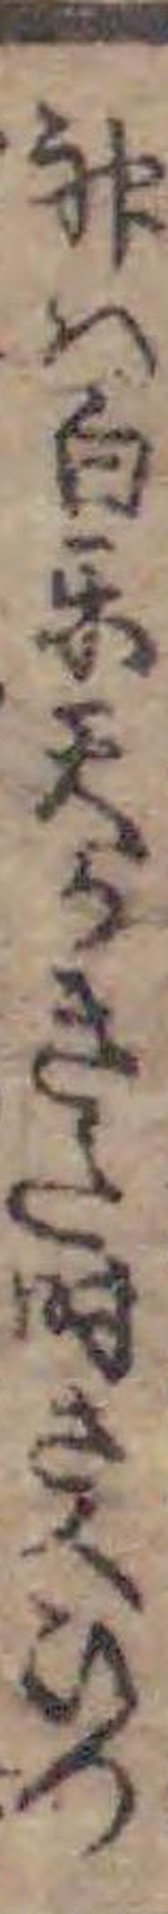神は白楽天かきた時さへひつ
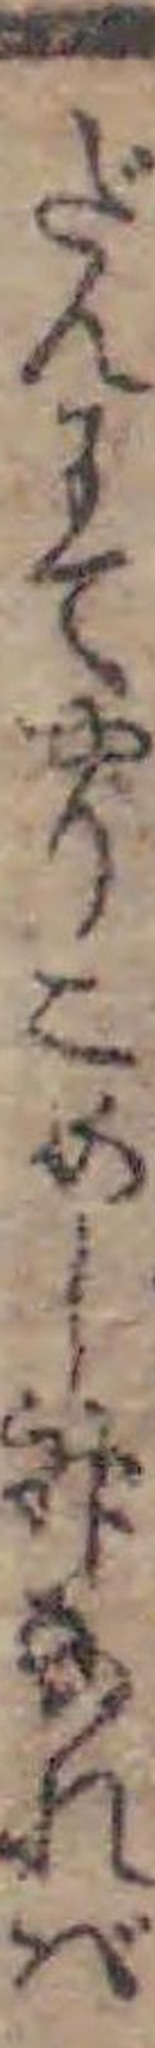だんにてやりこめし神なれば
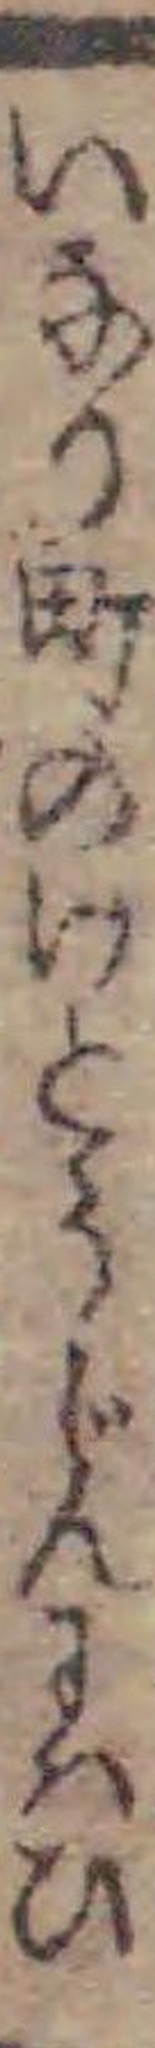いなり町のけとうじんにはひ
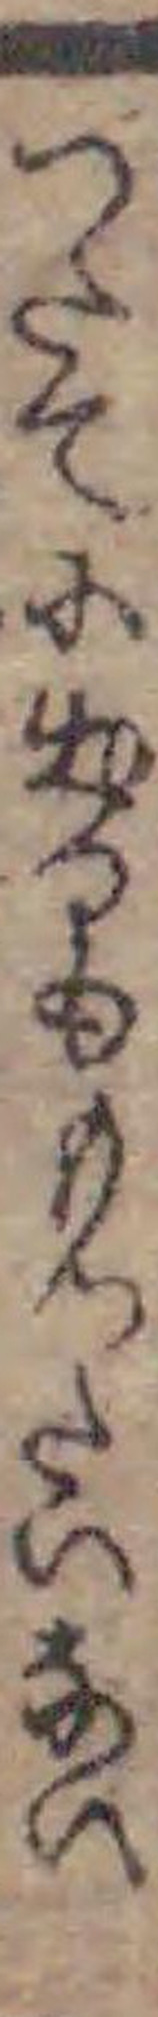つたてに出るもつたいない
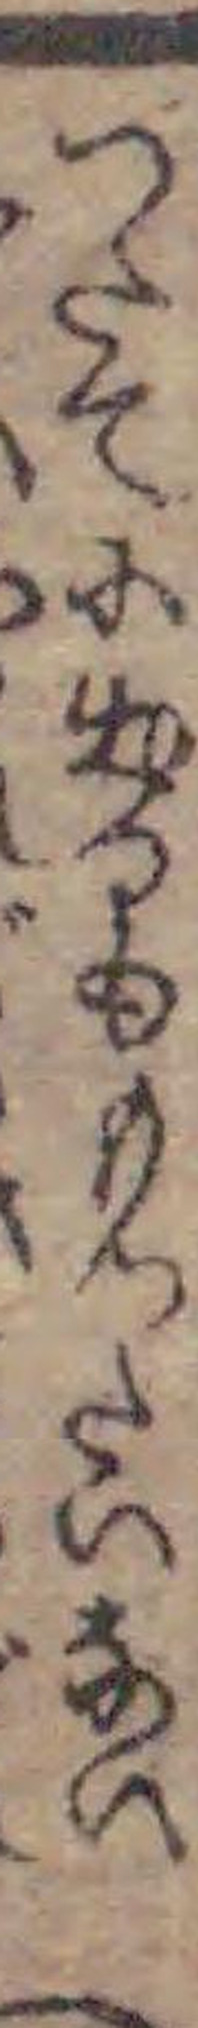つたてに出るもつたいない
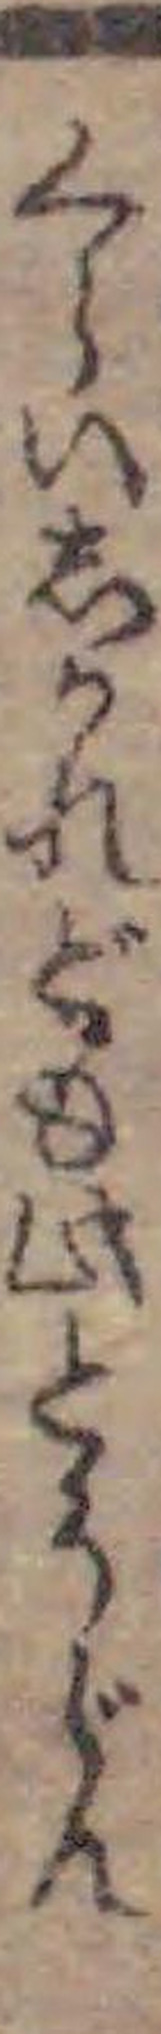くらいしかれども此とうじん
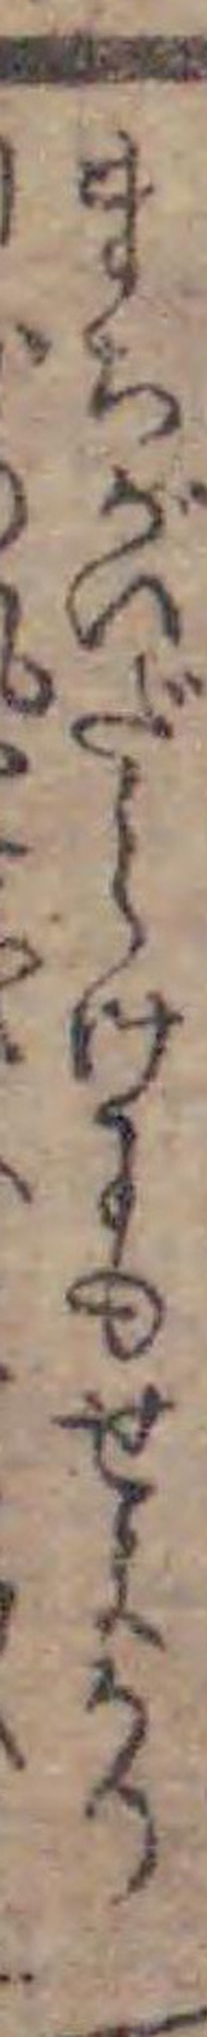まちがいだらけにもせよかり
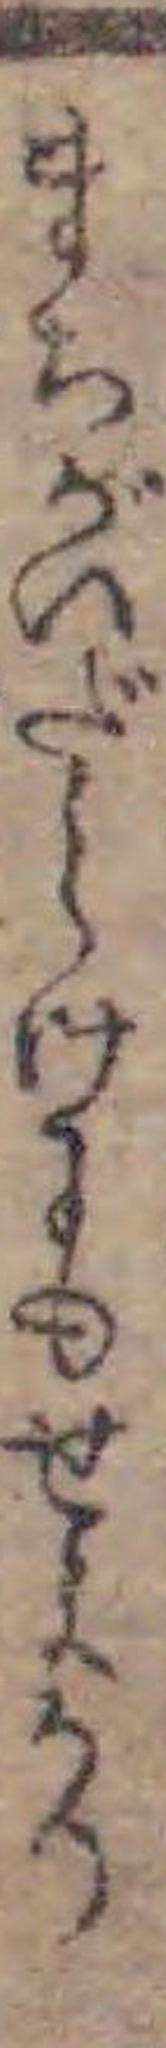まちがいだらけにもせよかり
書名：此奴和日本 : 2巻
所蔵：国立国会図書館 National Diet Library, JAPAN
